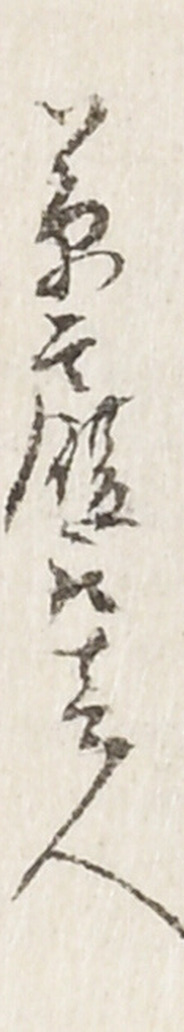草履取壱人
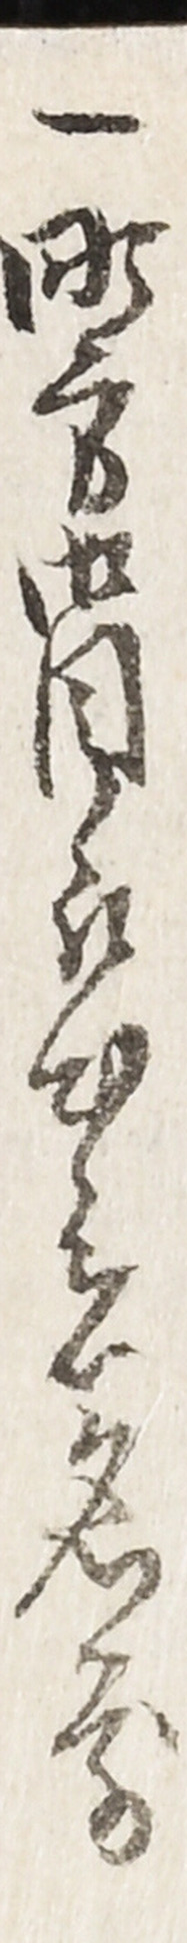一町方御目召出候者名前
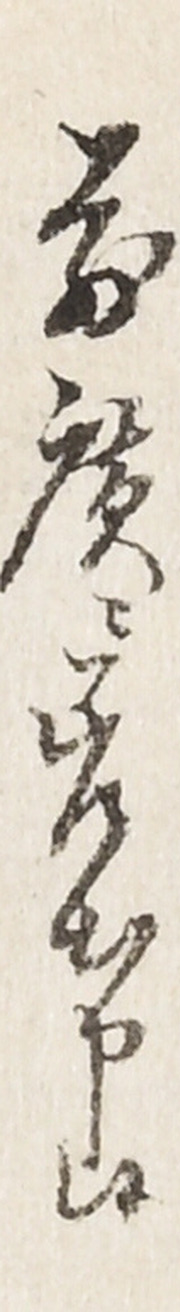前広ニ差出申候
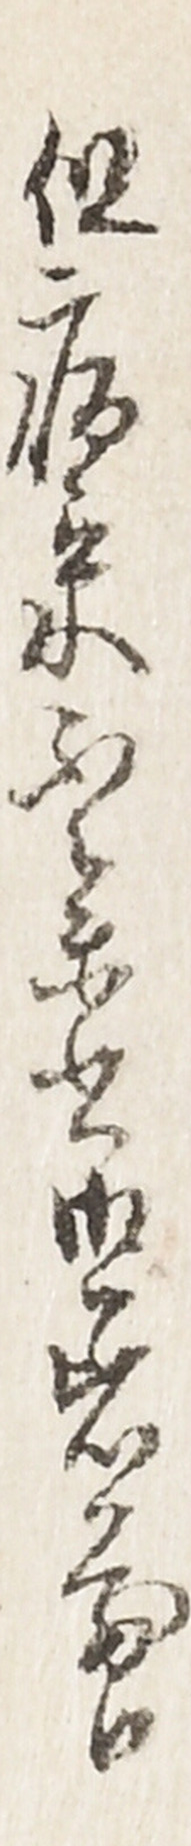但病気不参書御着寄候
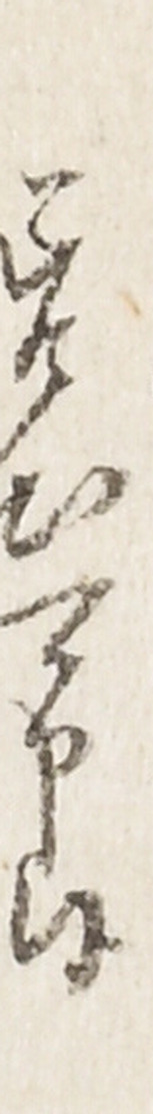差出可申候
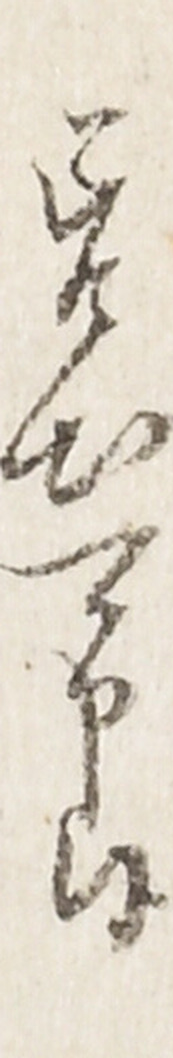差出可申候
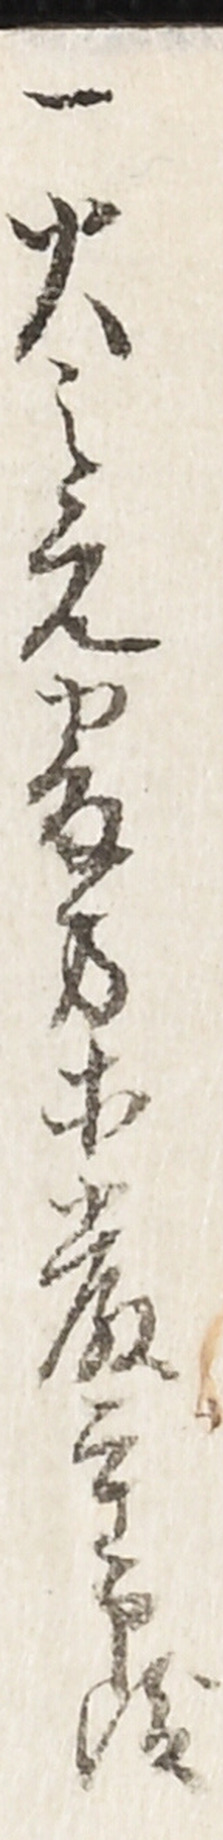一火之元番方等厳重申渡
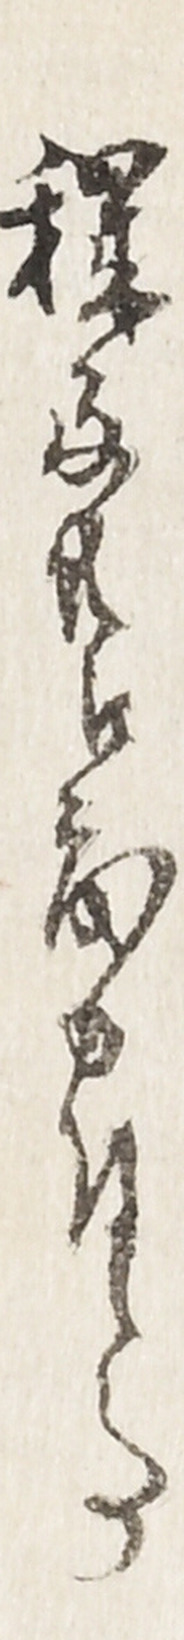穢多共江も申候事
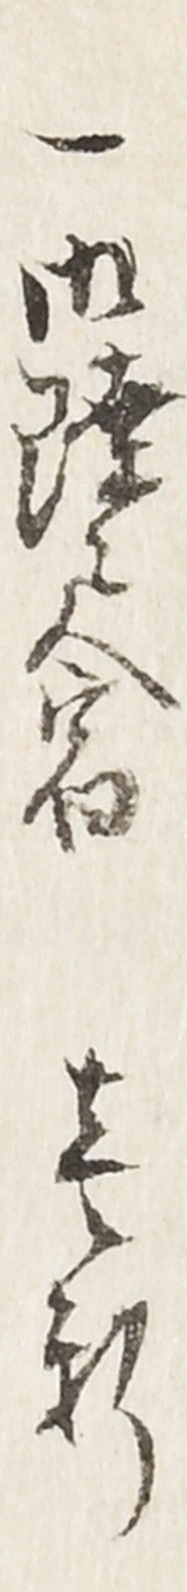一御陸尺人宿壱軒
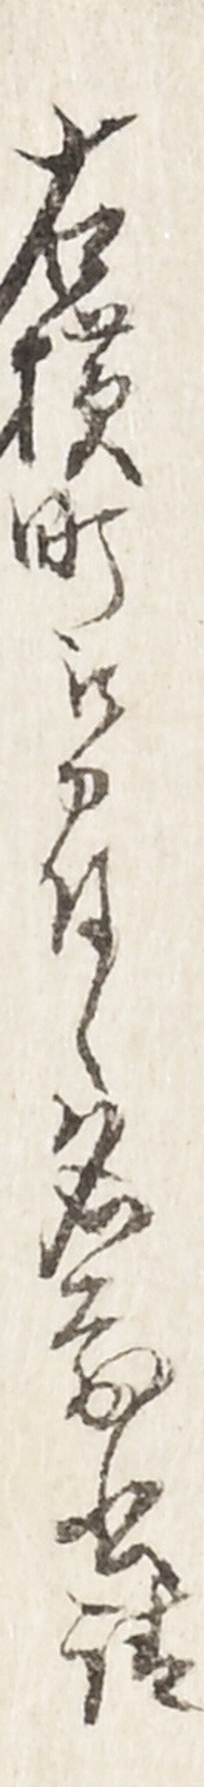右横町被申付候名前書請
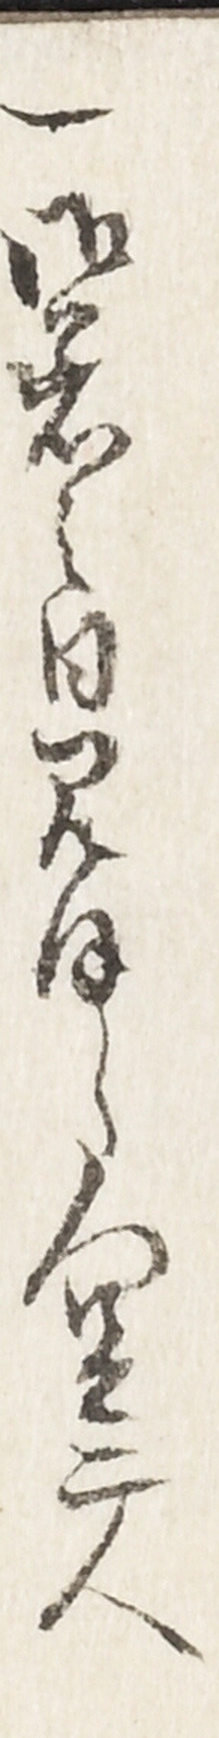一御着之日見ゆし人足二人
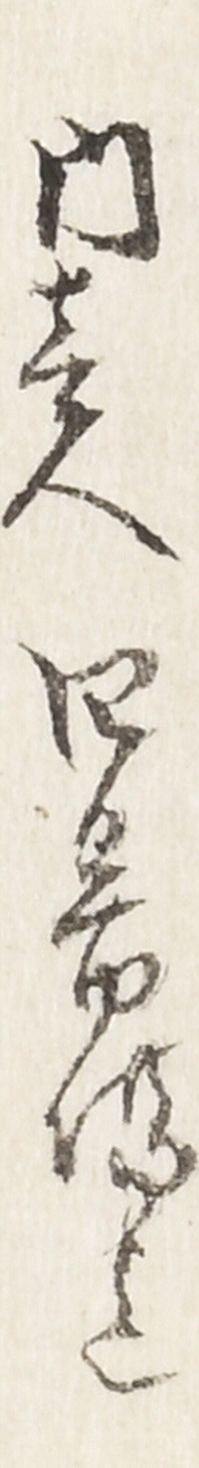内壱人四日市場迄
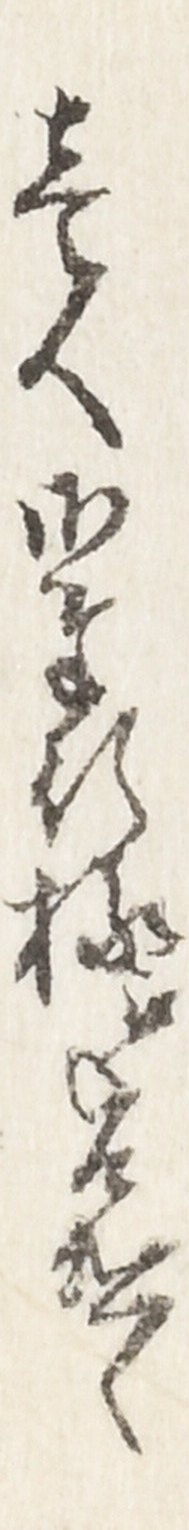壱人御奉行様江差遣候
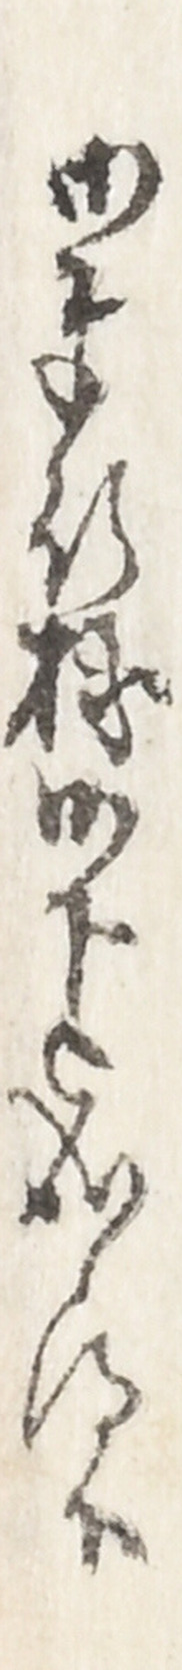御奉行様御下被成候得共
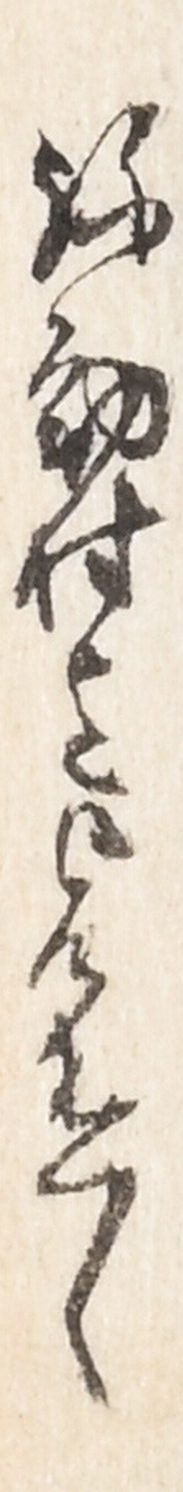弥助村迄差遣候

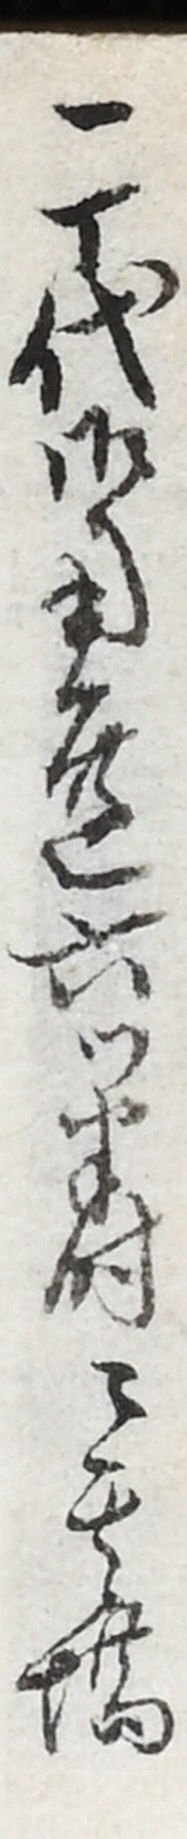一丁代御用辺六ツ半時に其場
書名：年内行事懐中録
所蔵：伊那市立高遠町図書館・合同会社AMANE
